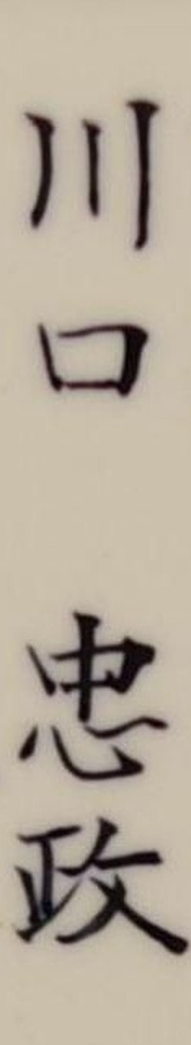川口忠政
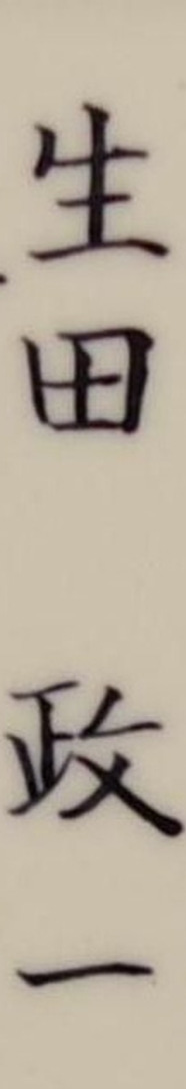生田政一
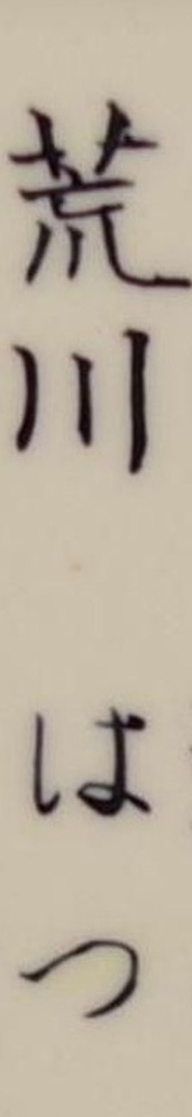荒川はつ
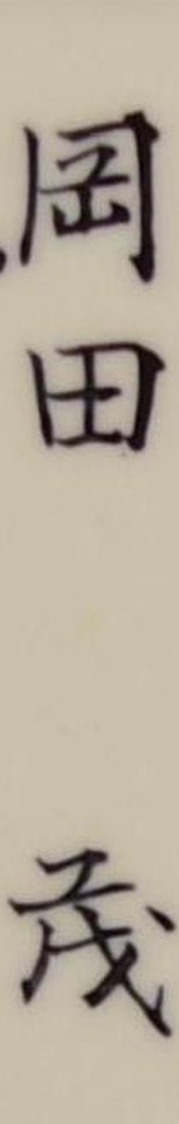岡田茂
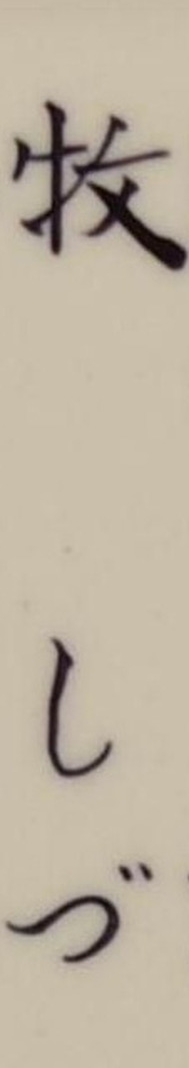牧しづ
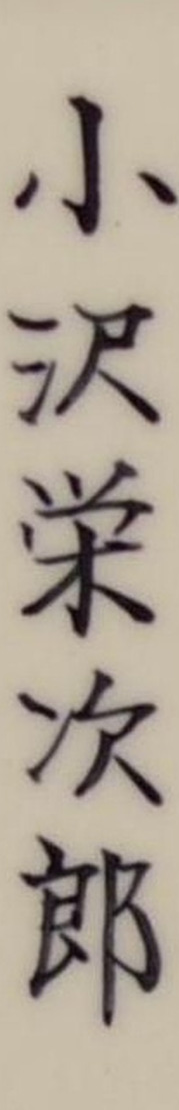小沢栄次郎
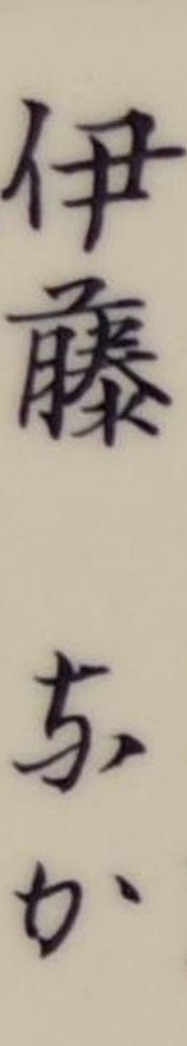伊藤なか
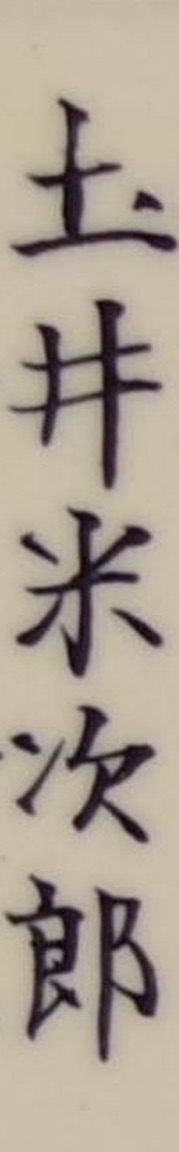土井米次郎
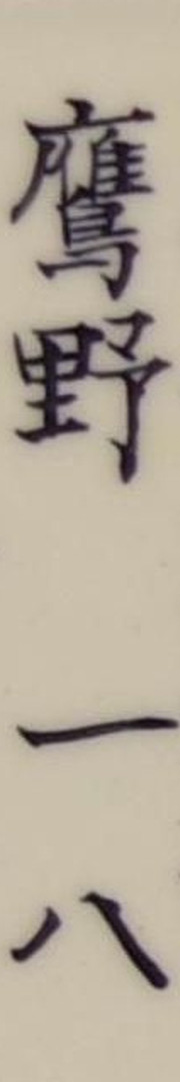鷹野一八
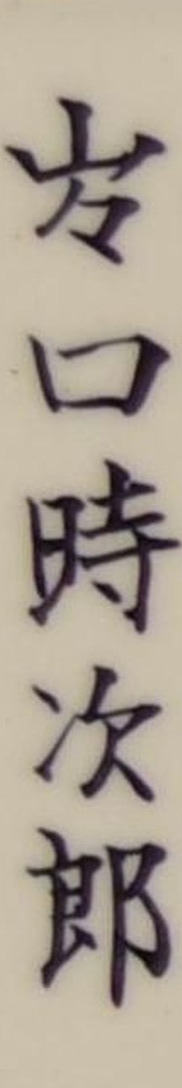㞮口時次郎

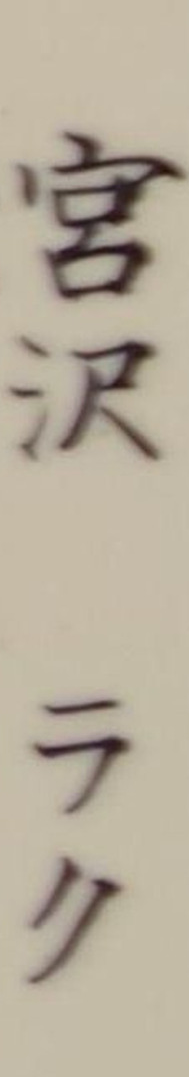宮沢ラク
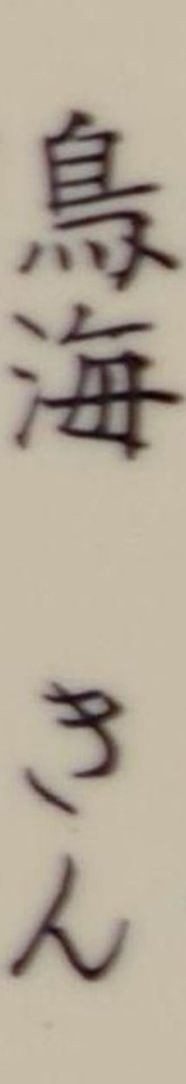鳥海きん
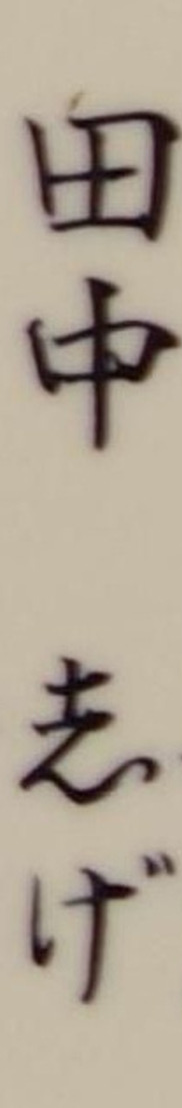田中しげ
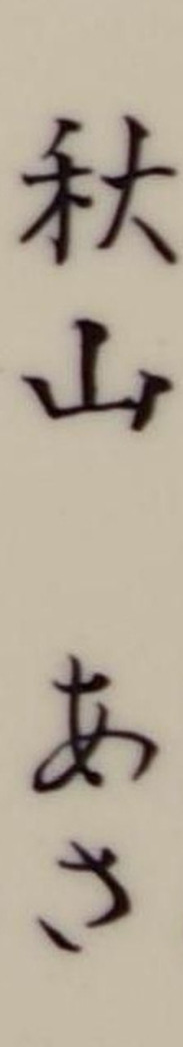秋山あさ
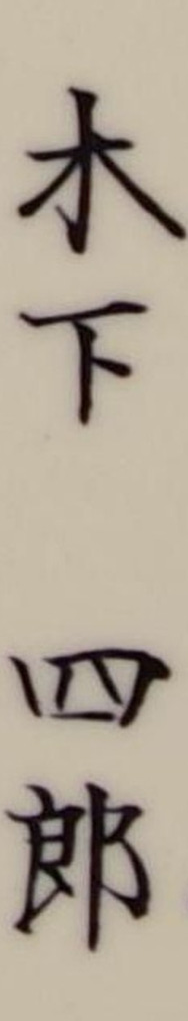木下四郎
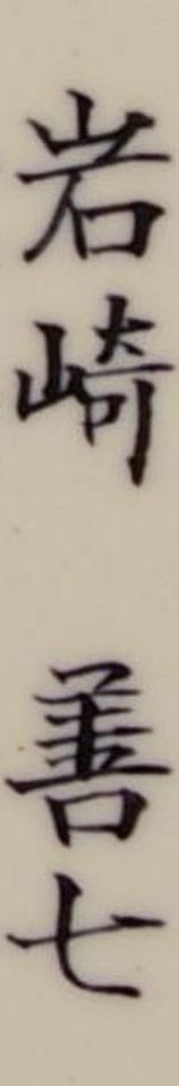岩崎善七
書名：M~S
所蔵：高野山金剛峯寺
